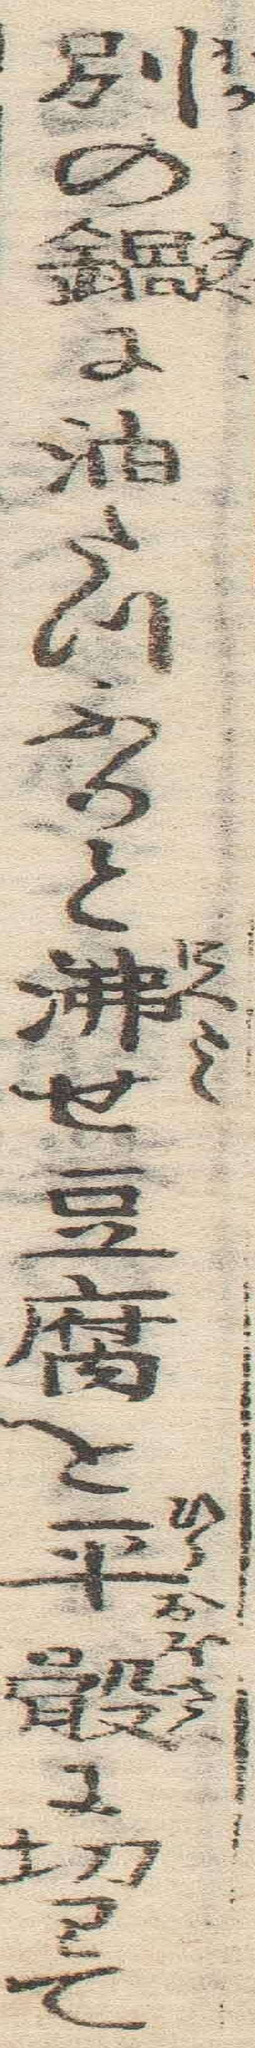別の鍋に油たつふりと沸せ豆腐を平骰に切りて
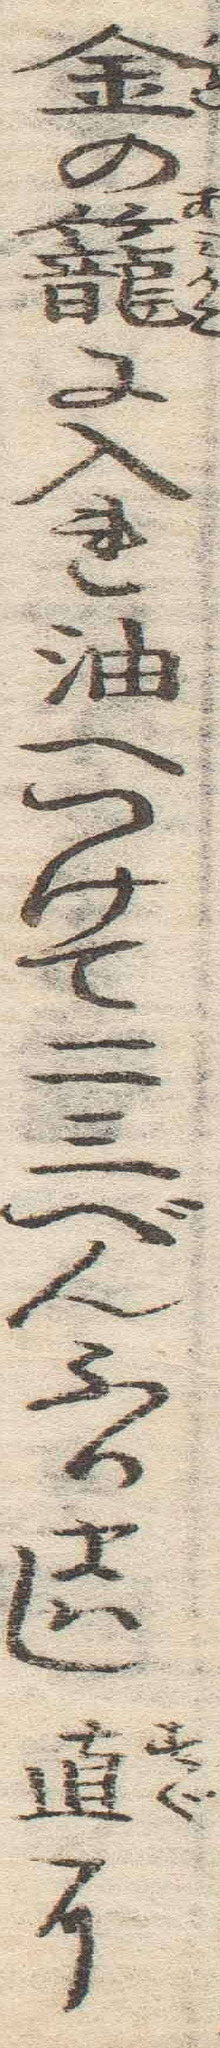金の籠に入れ油へつけて二三べんふりまはし直に
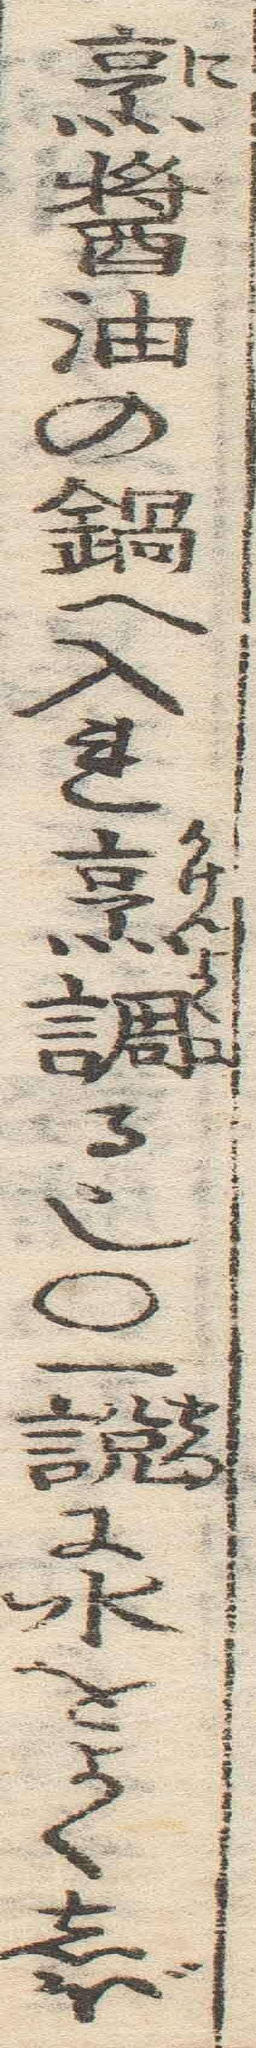烹醤油の鍋へ入れ烹調る也○一説に水をよくしぼ
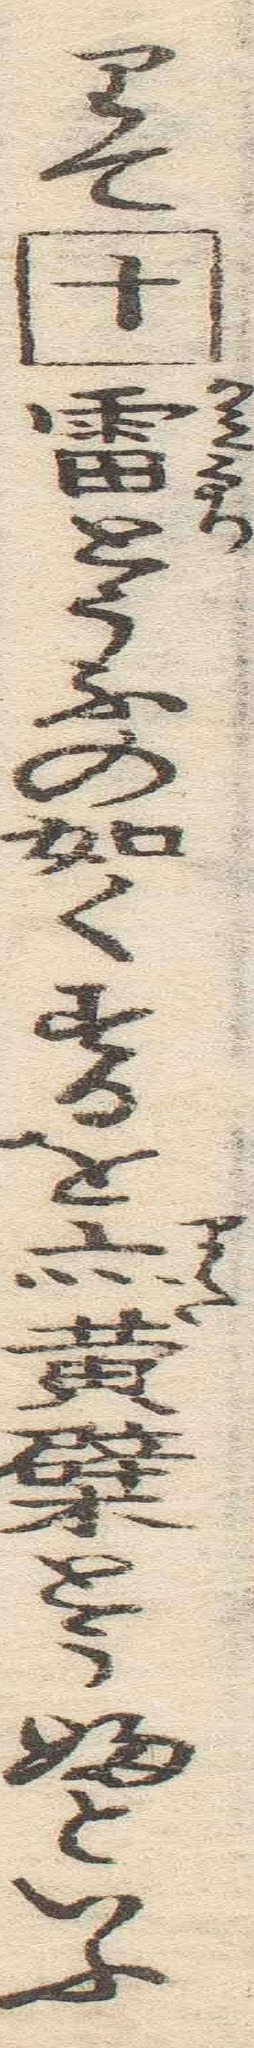りて[十]雷とうふの如くするを亦黄檗とうふといふ
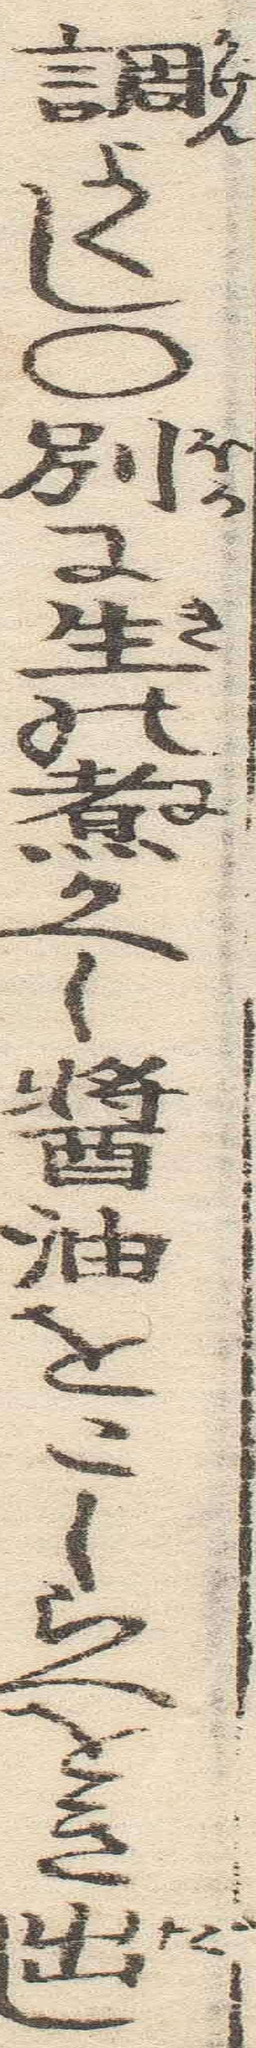調よくし○別に生の煮かへし醤油をこしらへをき出し
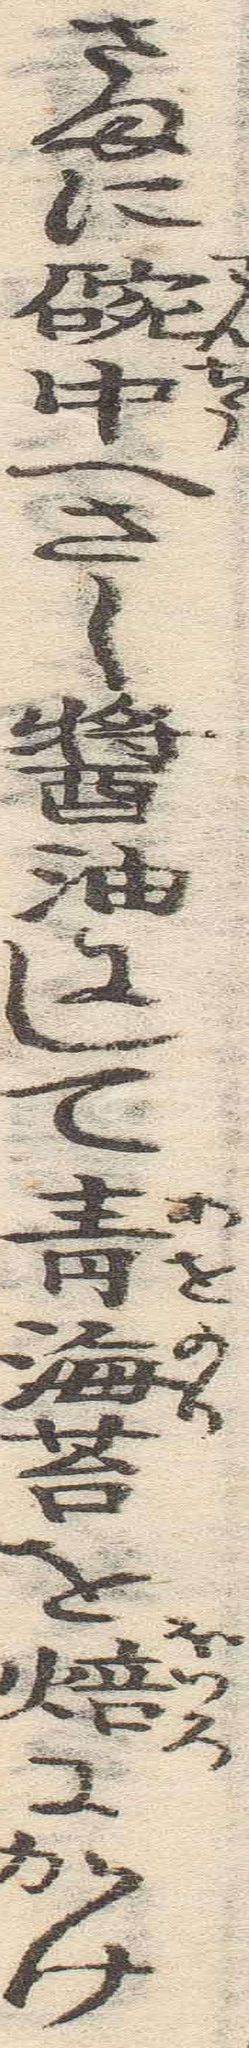さまに碗中へさし醤油にして青海苔を焙にかけ
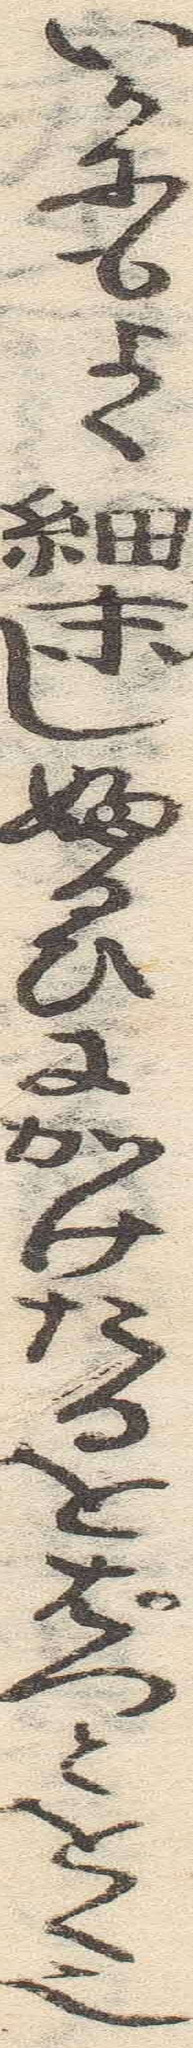いかにもよく細末しふるひにかけたるをぱつとをく也
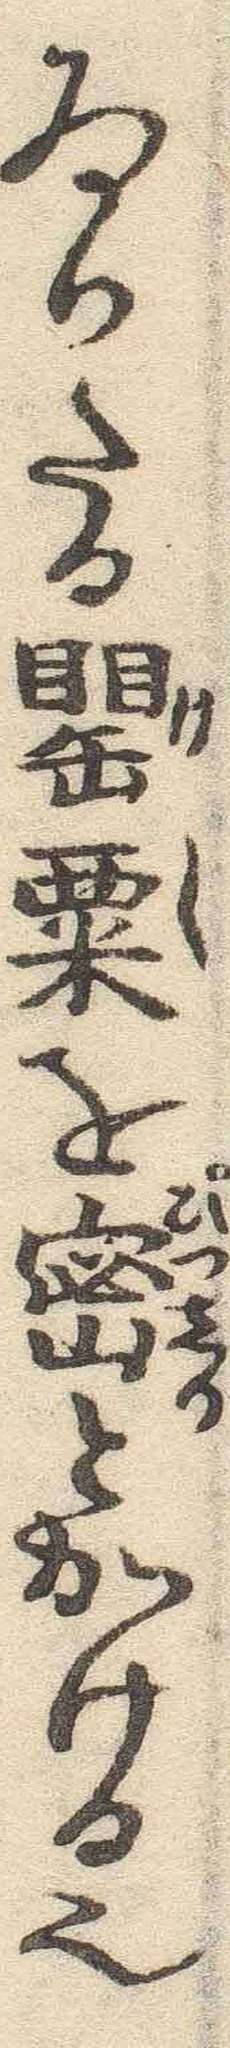ゐりたる罌粟を密とかける也
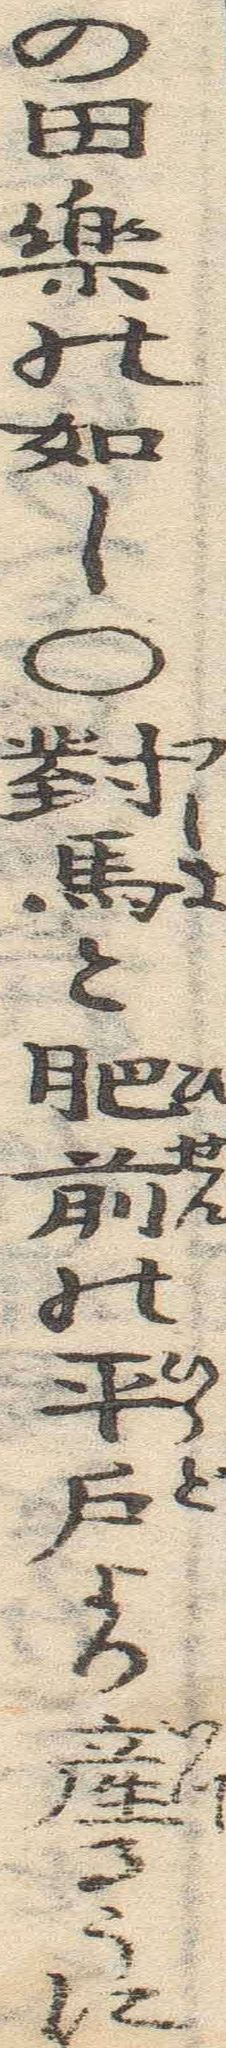の田楽の如し○対馬と肥前の平戸より産るうに
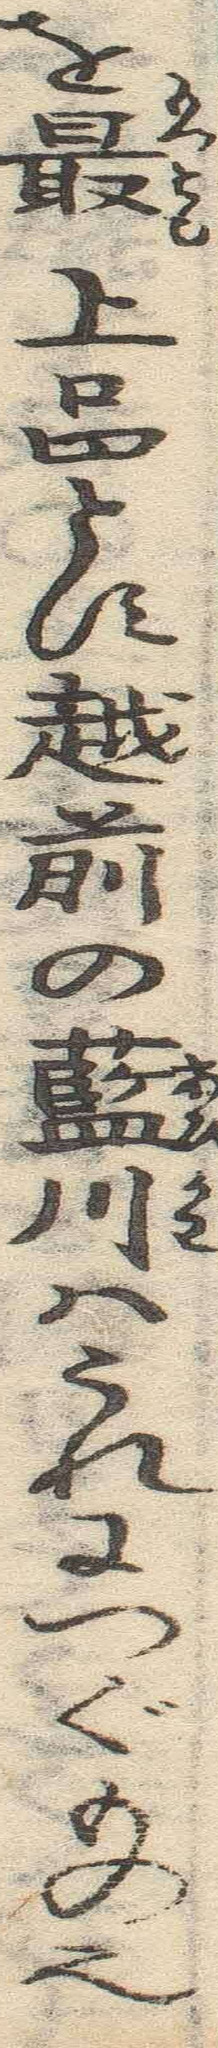を最上品とす越前の藍川はこれにつぐもの也
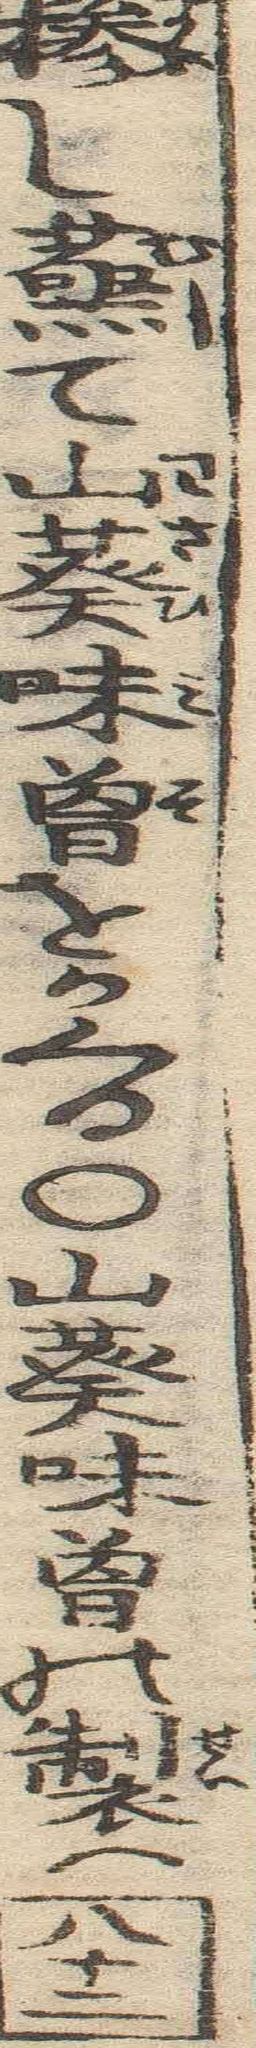糝し蒸て山葵味曽をかくる○山葵味曽の製は[八十二]

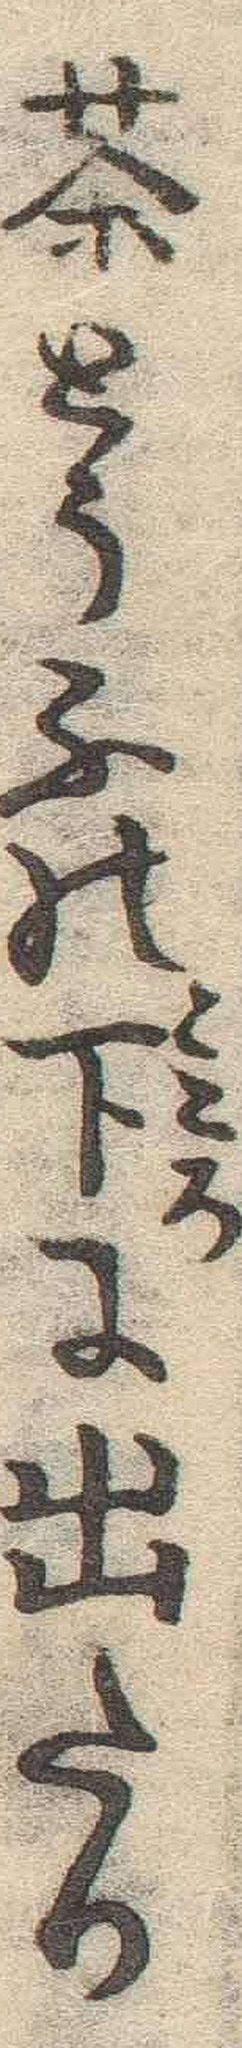茶とうふの下に出たり
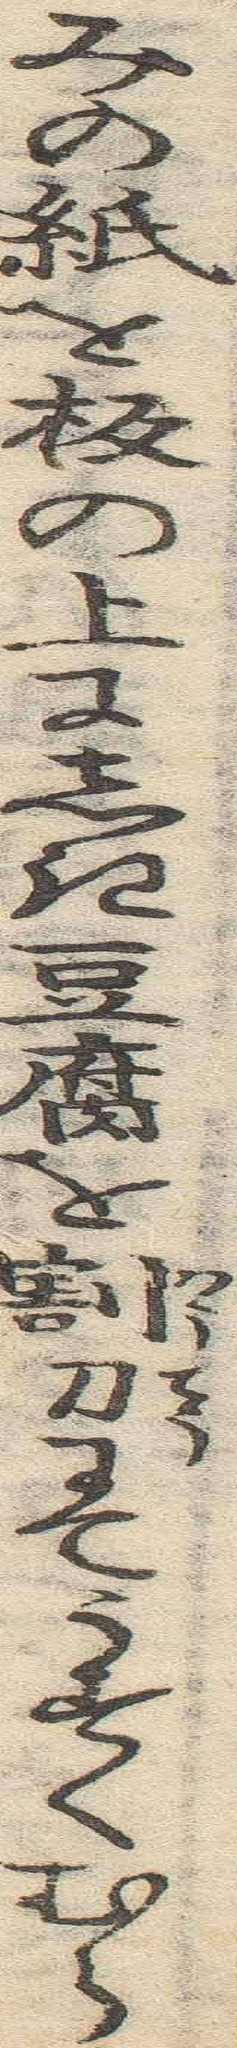みの紙を板の上にしき豆腐を割刀にてうすくむら
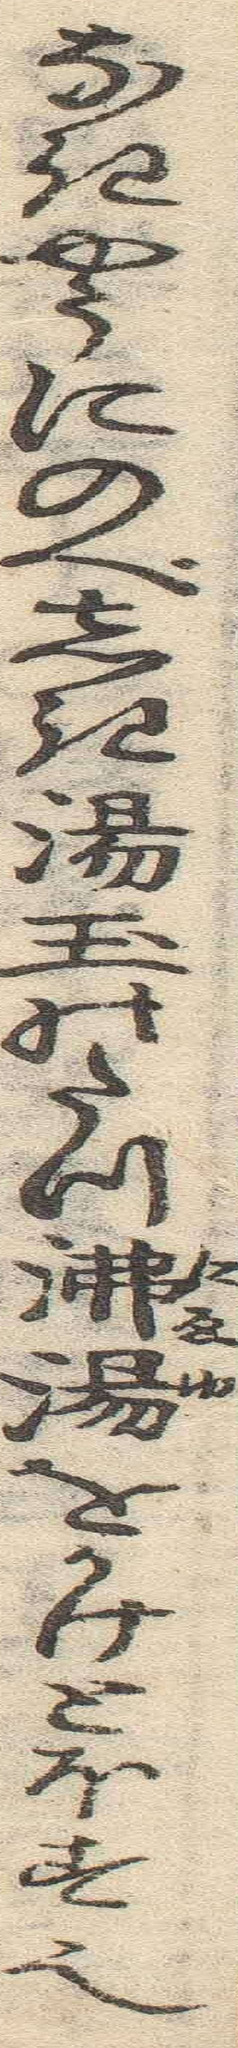なきやうにのべしき湯玉のたつ沸湯をかけとほす也
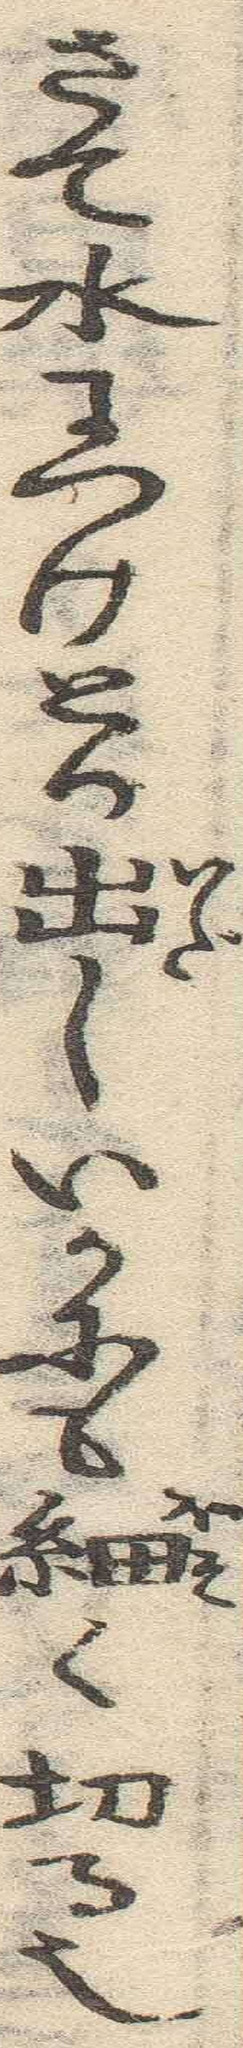さて水につけとり出しいかにも細く切る也
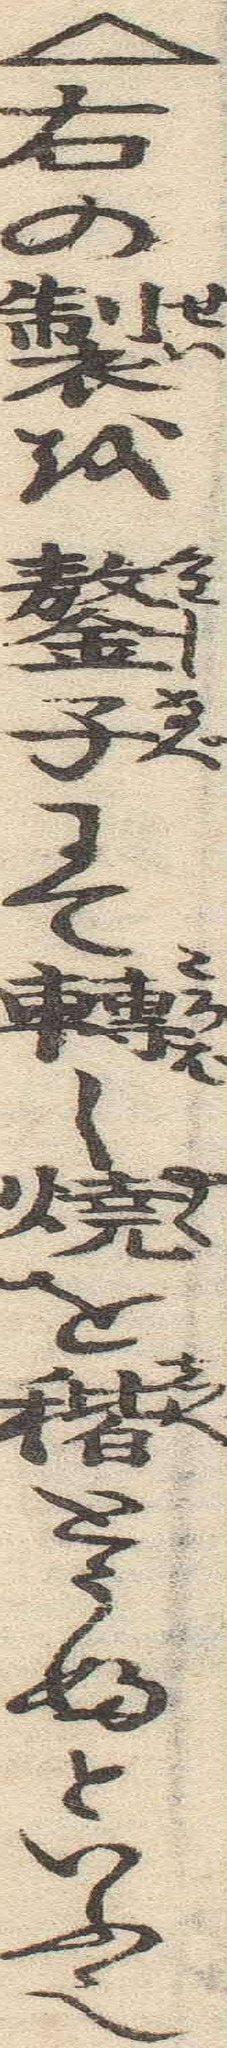△右の製を鏊子にて転し焼を稭とうふといふ也
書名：豆腐百珍
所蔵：東京学芸大学附属図書館 国文学研究資料館
